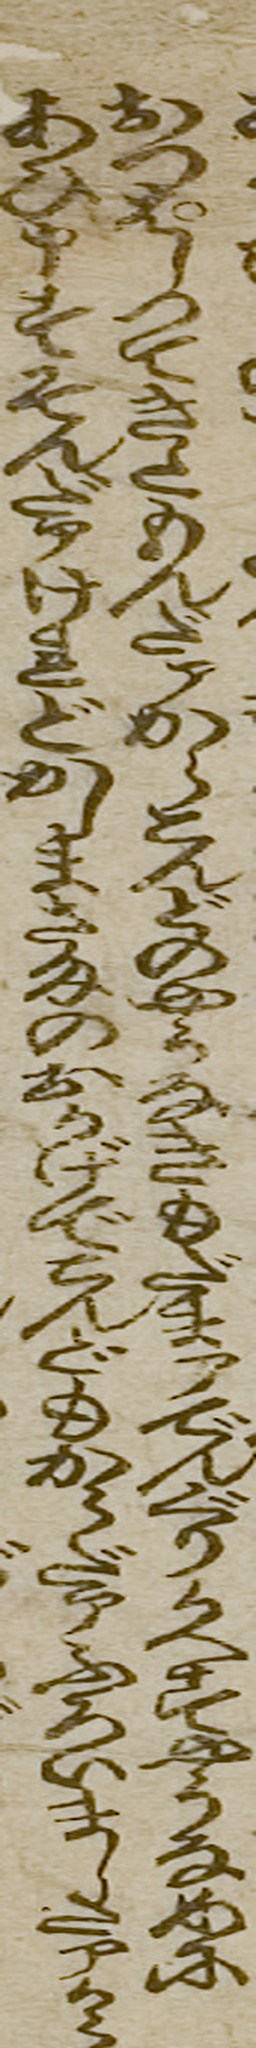あひ申すそんだァけれどかしまさまのおかげでこんどもからだァふろいましたァから
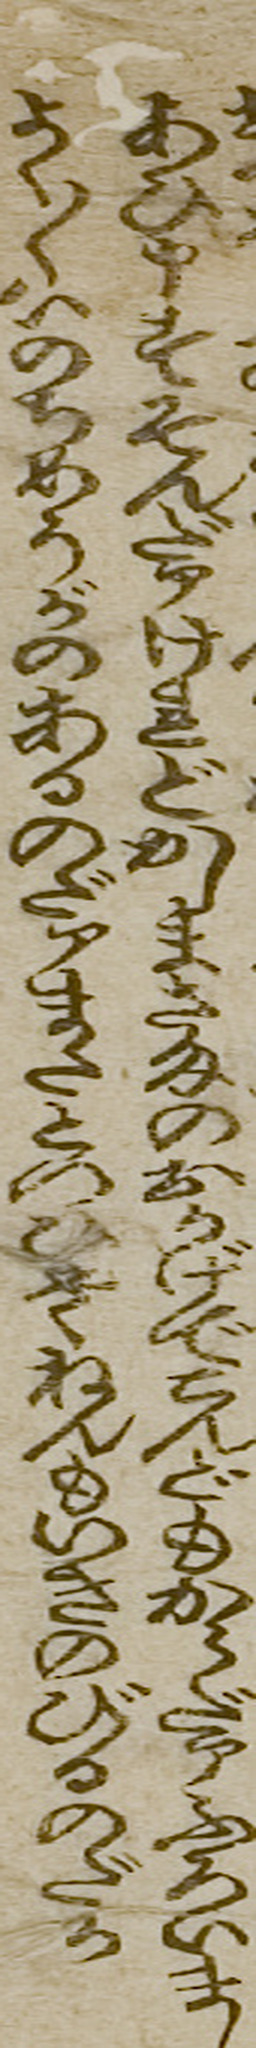よく〳〵いのちめうがのあるのだァまたとのひやくねんもいきのびるのだろ
